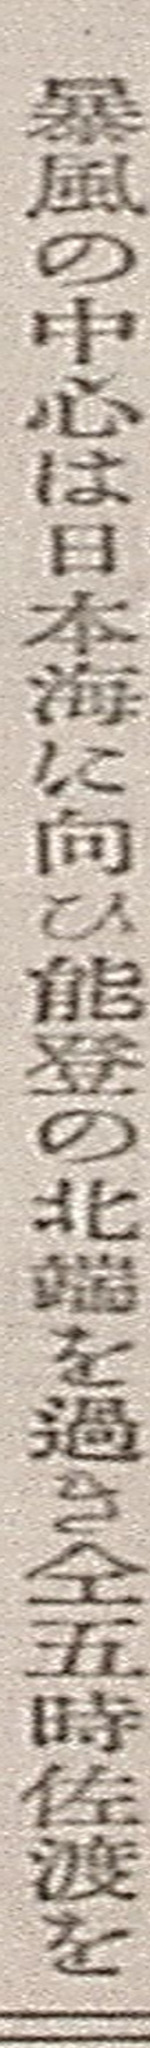暴風の中心は日本海に向ひ能登の北端を過き仝五時佐渡を
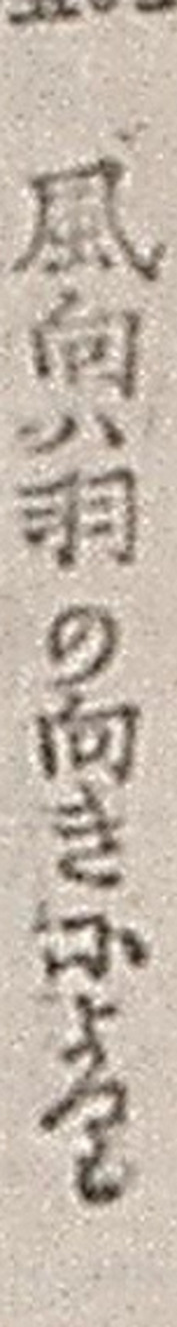風向ハ羽の向きにより
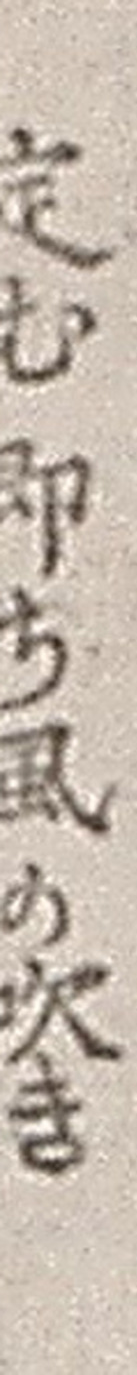定む即ち風の吹き
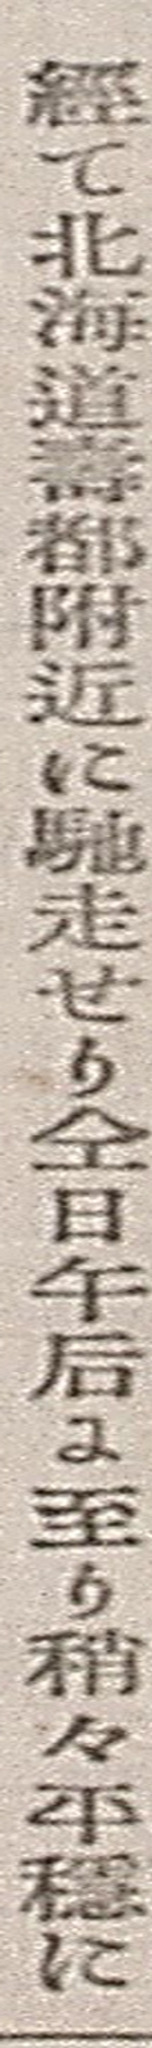経て北海道寿都附近に馳走せり仝日午后に至り稍々平穏に
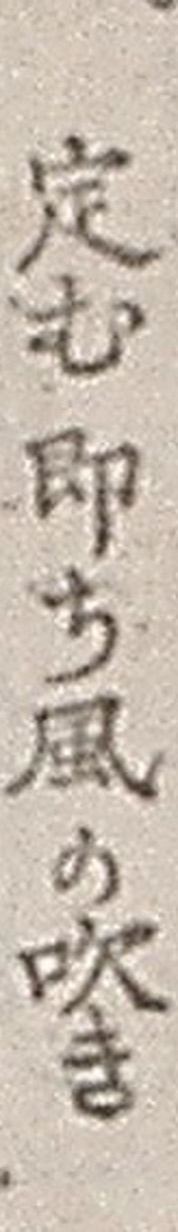定む即ち風の吹き
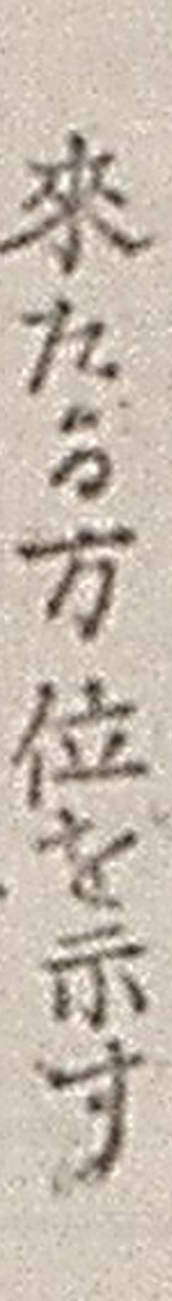来たる方位を示す
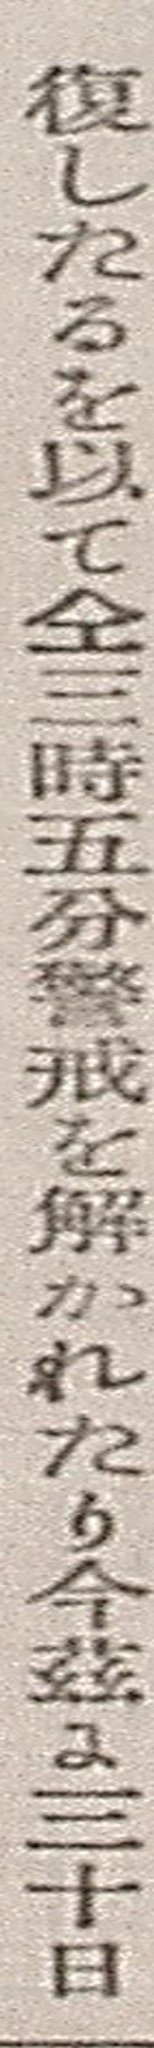復したるを以て仝三時五分警戒を解かれたり今茲に三十日
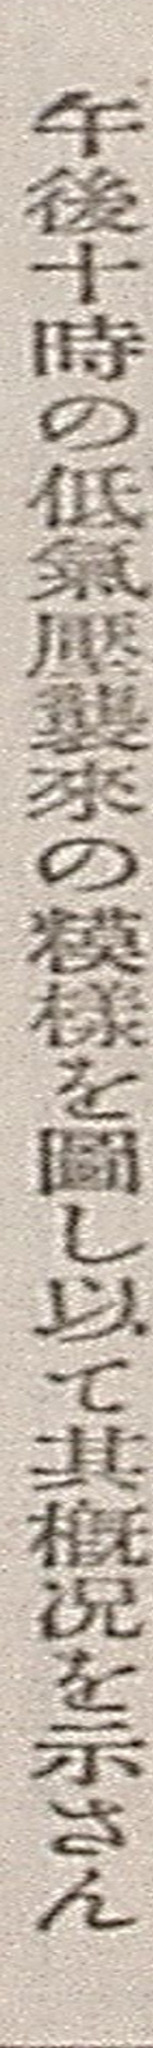午後十時の低気圧襲来の模様を図し以て其概況を示さん
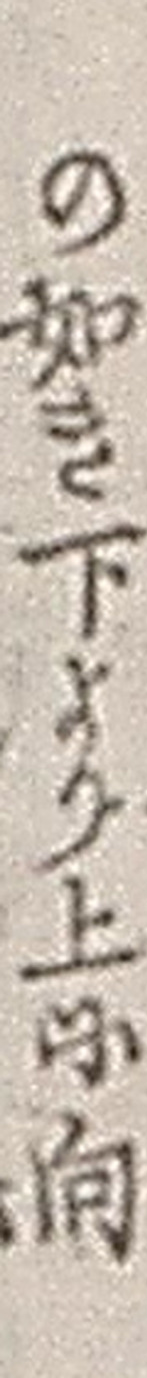の如き下より上に向
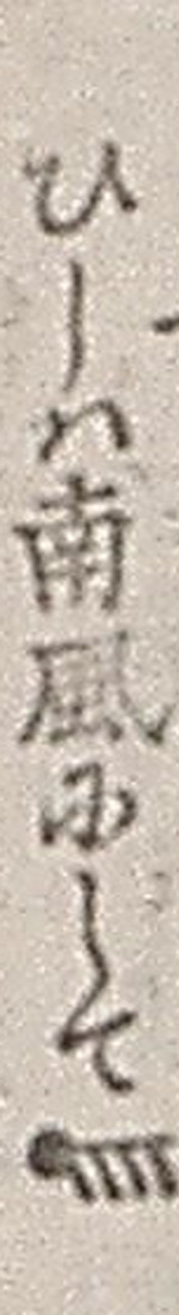ひしハ南風にして
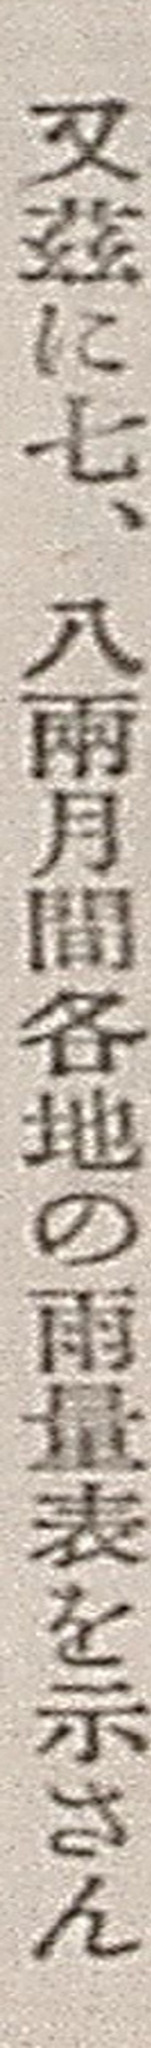又茲に七、八両月間各地の雨量表を示さん
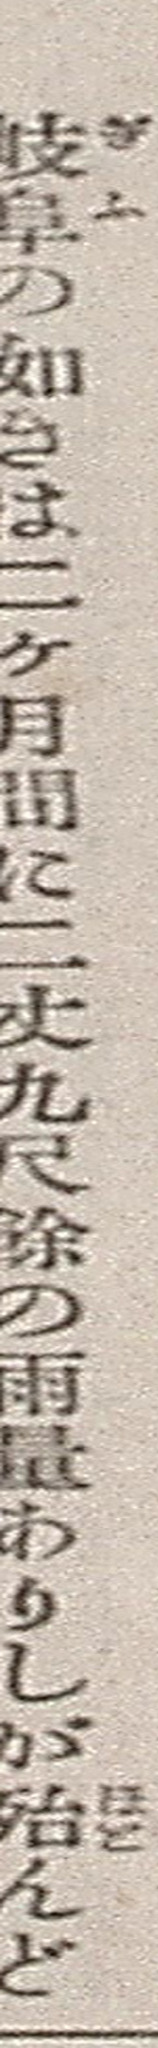岐阜の如きは二ヶ月間に二丈九尺余の雨量ありしが殆んど
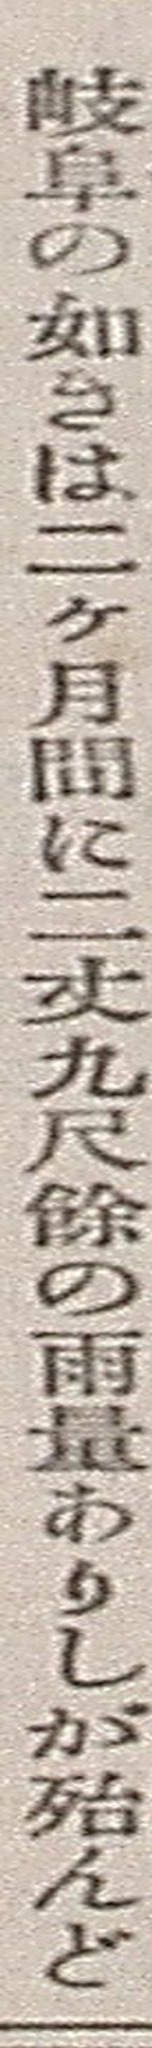岐阜の如きは二ヶ月間に二丈九尺余の雨量ありしが殆んど
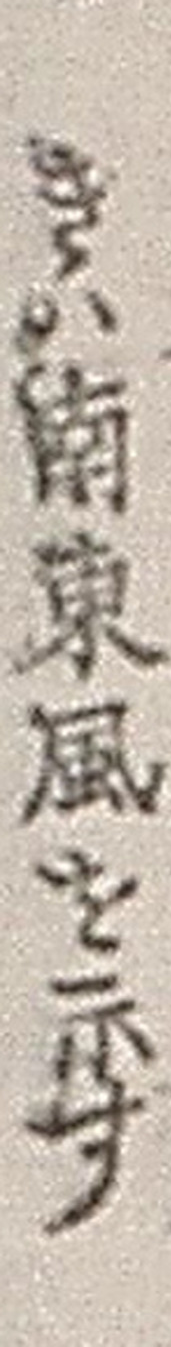きハ南東風を示す
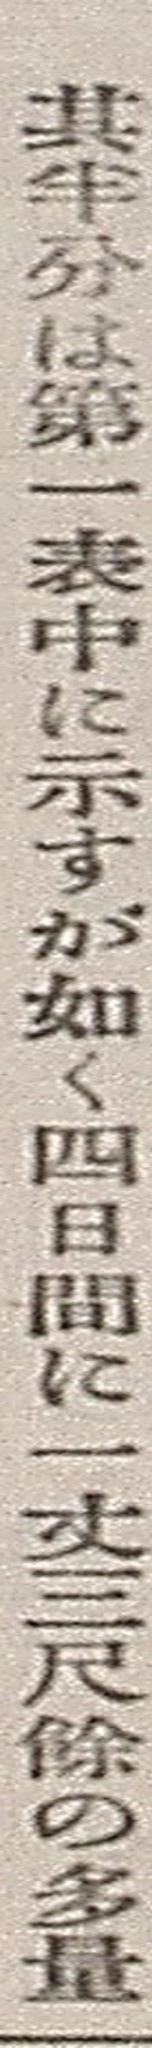其半分は第一表中に示すが如く四日間に一丈三尺余の多量
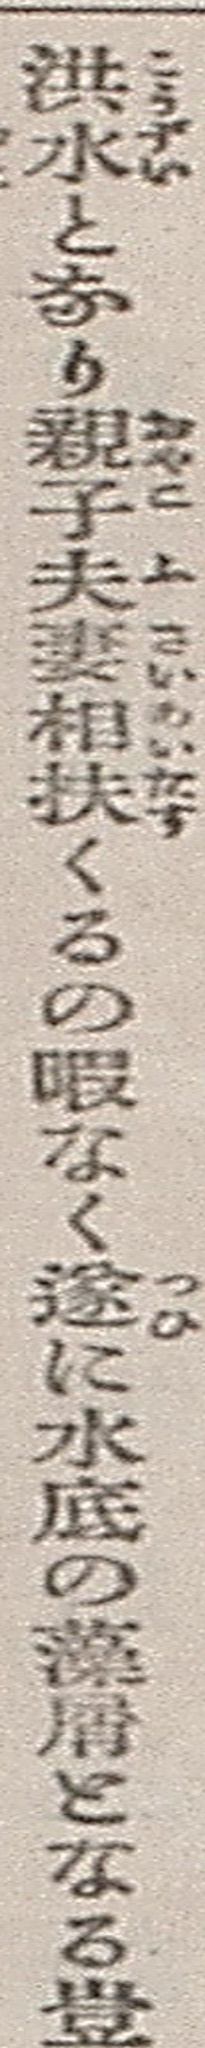洪水となり親子夫妻相扶くるの暇なく遂に水底の藻屑となる豈
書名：風俗畫報臨時増刊第百二十四號　洪水地震被害録（上）
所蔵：東京大学地震研究所図書室 Earthquake Research Institute Library, The University of Tokyo, JAPAN
